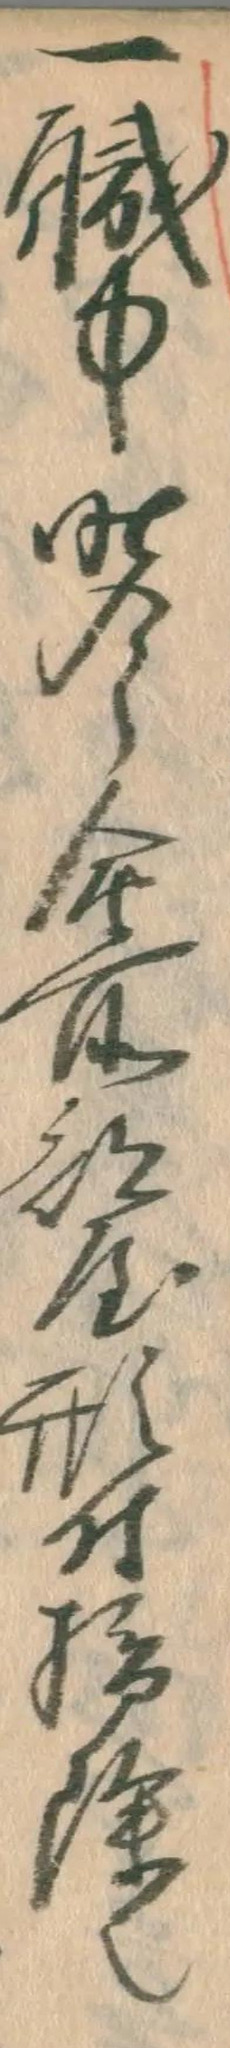一職中昨今会所部屋形付指除也
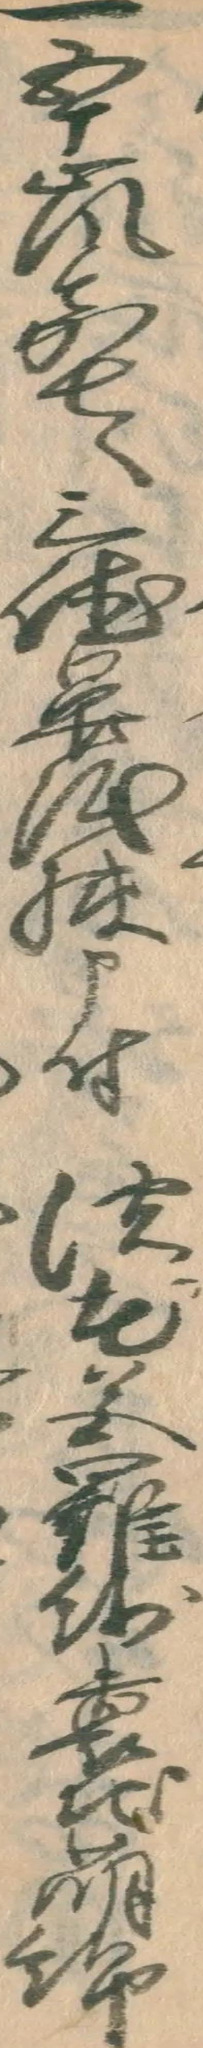一五十嵐嘉七へ三徳鼻紙挟申付濃花色羅紗裏地萌綿
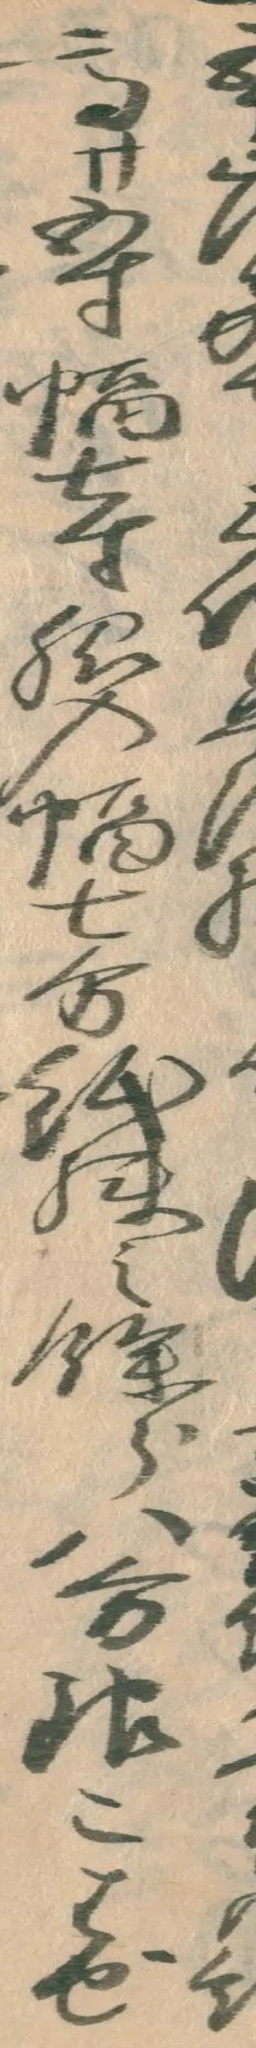高サ五寸幅七寸脇入幅七分紙挟之余分八分銀こはぜ
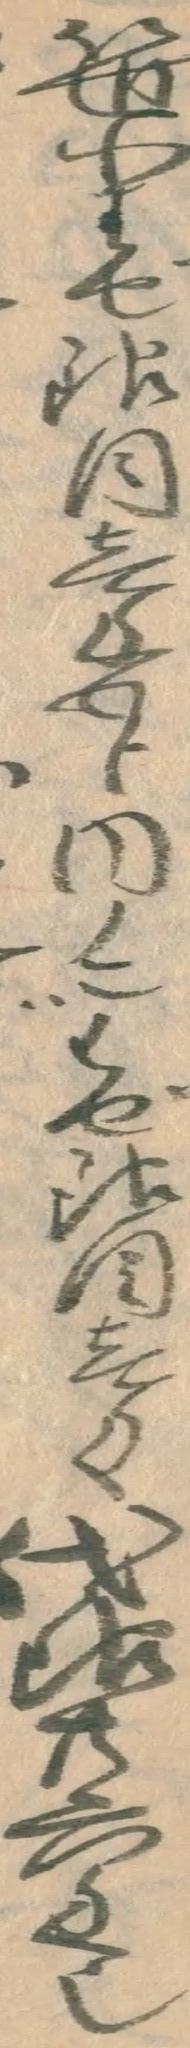笹小はぜ銀目壱匁五歩内ノこはぜ銀目壱匁代銀廿六匁也
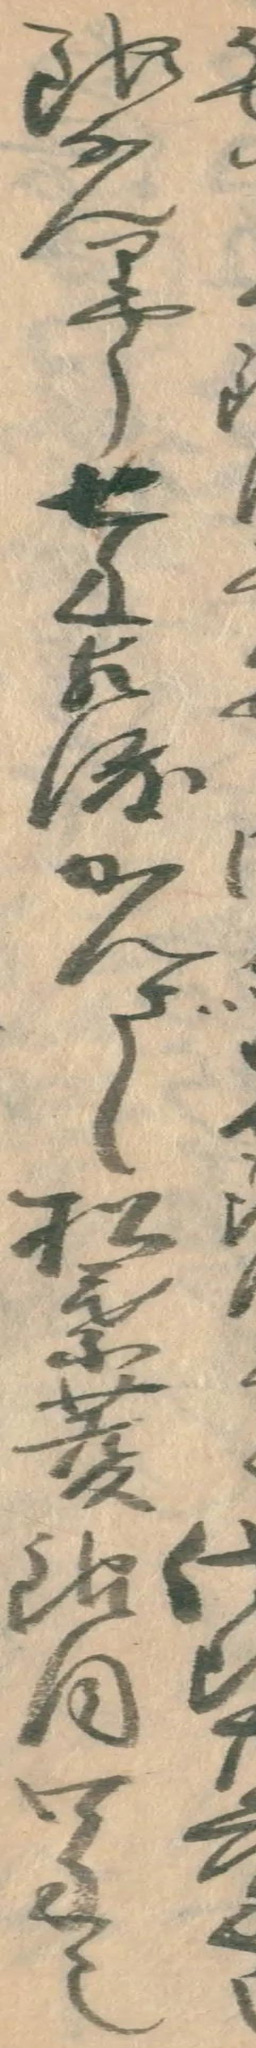銀なんりやう七匁相渡かんざし松葉菱銀目四匁也
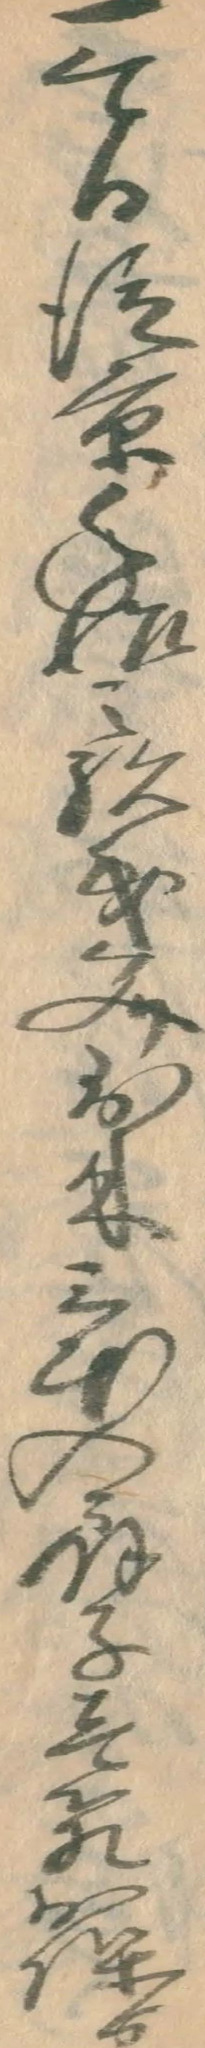一今日従京年始之祝義文到来三本入扇子壱箱保ゟ

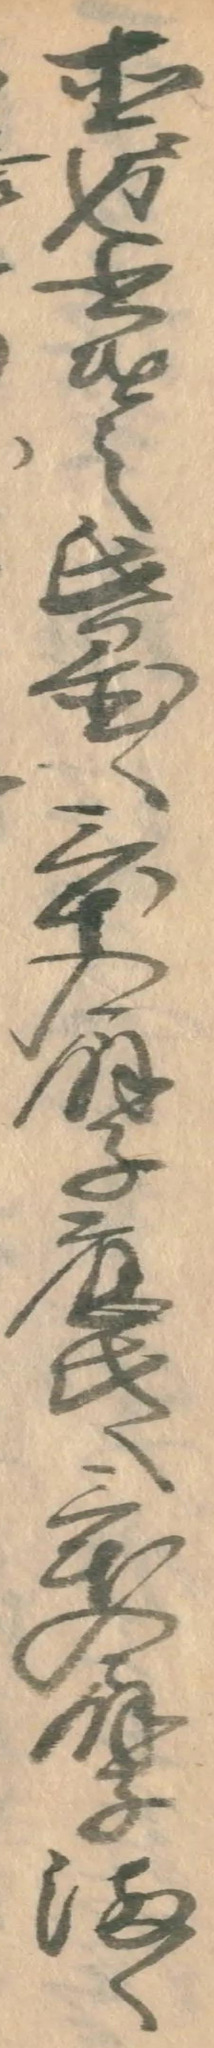直ニ返書遣之氏置へ三本入扇子応氏へ三本入扇子満々
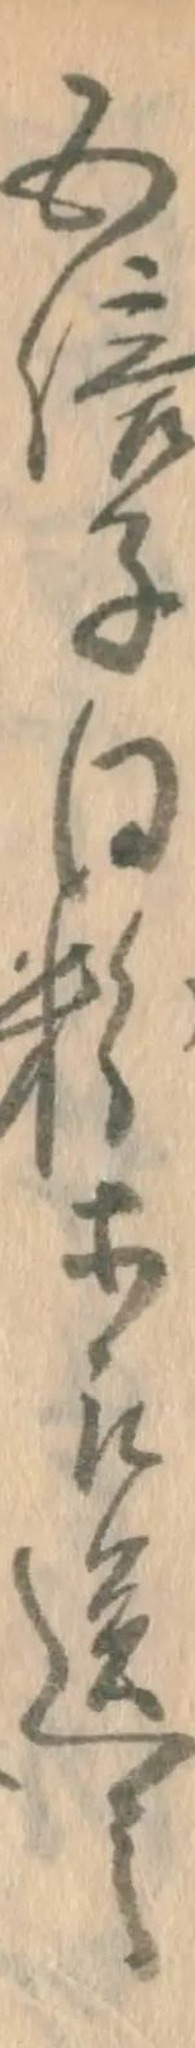五倍子白粉等被送之
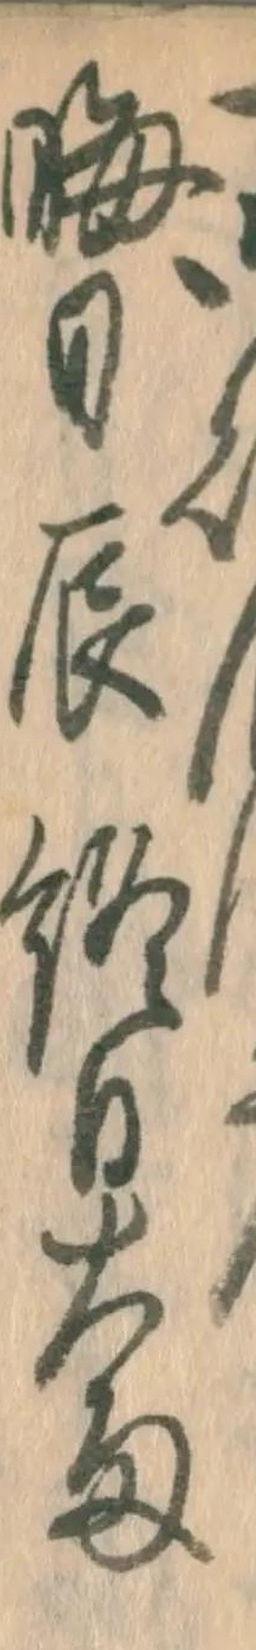晦日辰終日大雨
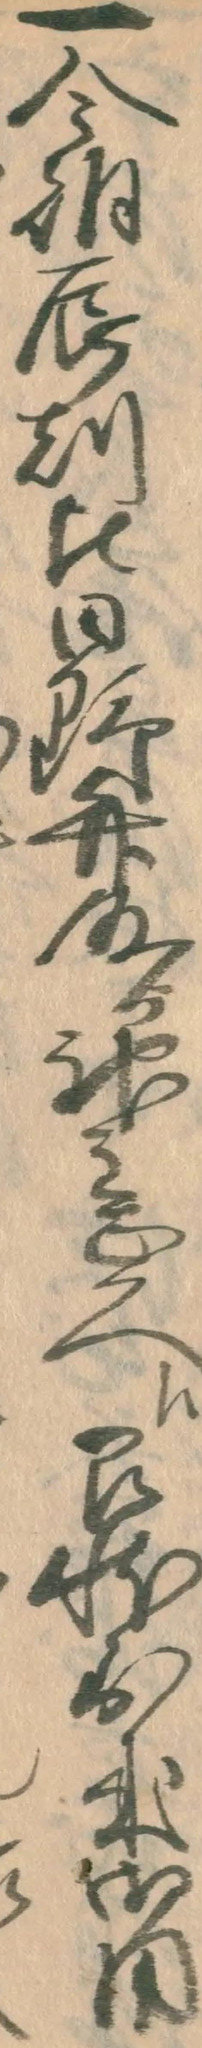一今朝辰ノ刻比日野弁殿ゟ神主正久江召状到来御用
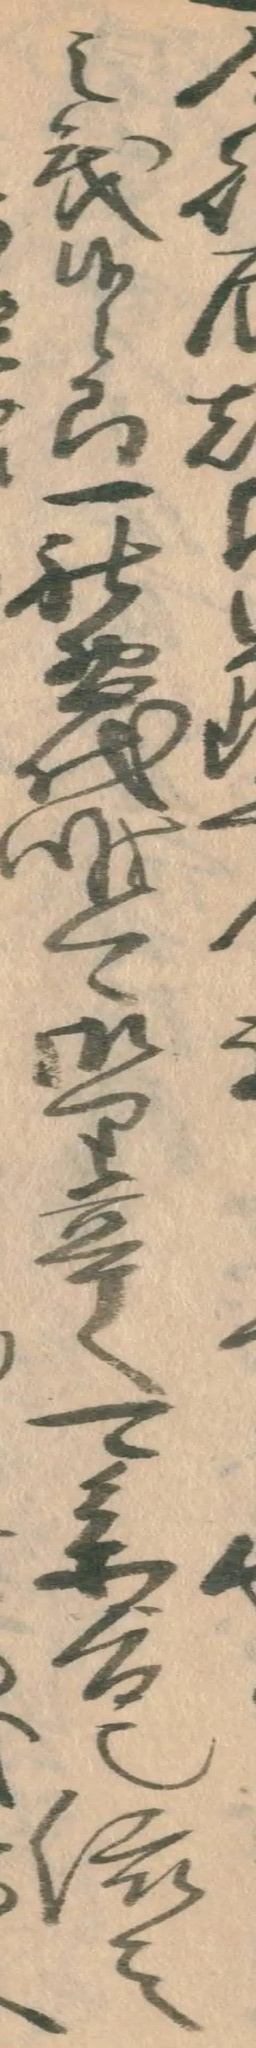之義候間一社惣代唯今御里亨へ可参旨也依之
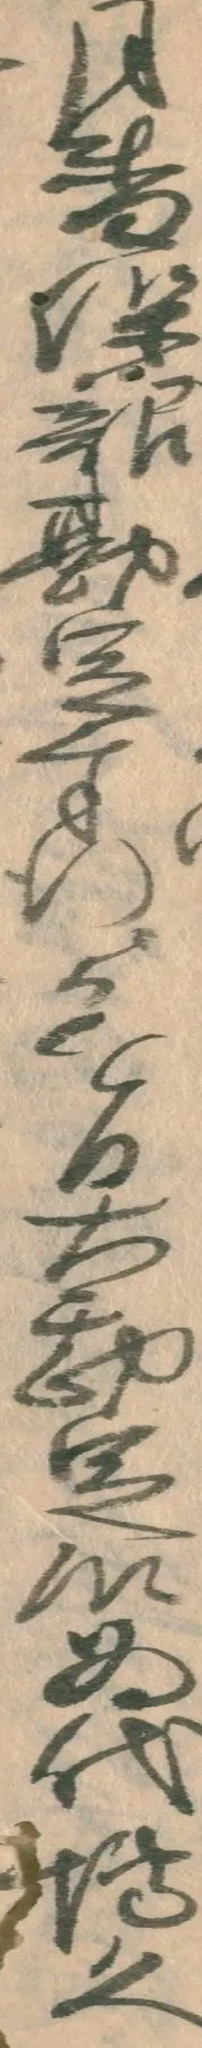月番保韶勘定奉行ニ而今日大勘定故為代博久
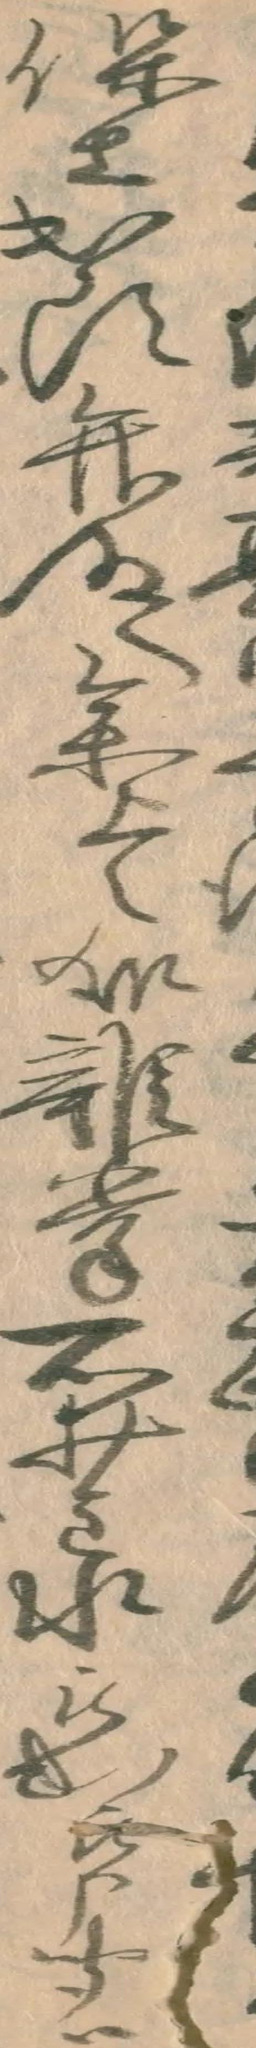保土出頭弁殿へ参上之処雑掌石井主水被出被申聞ハ
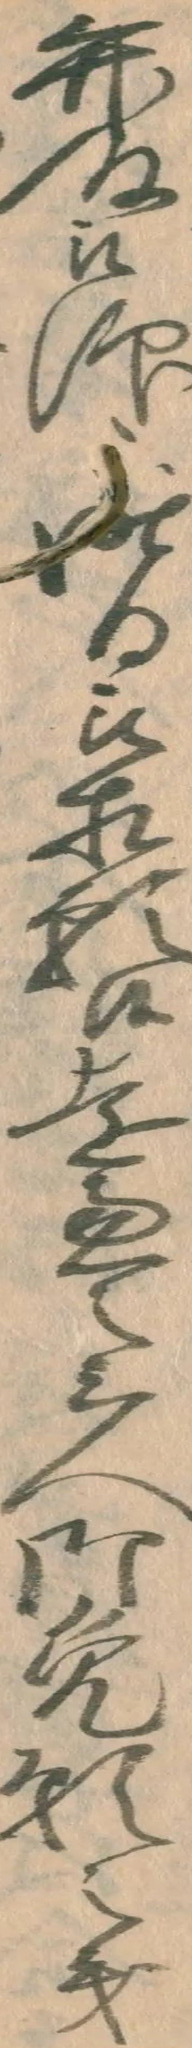弁殿被仰候ハ昨日被相願候遠慮之三人御免願之義
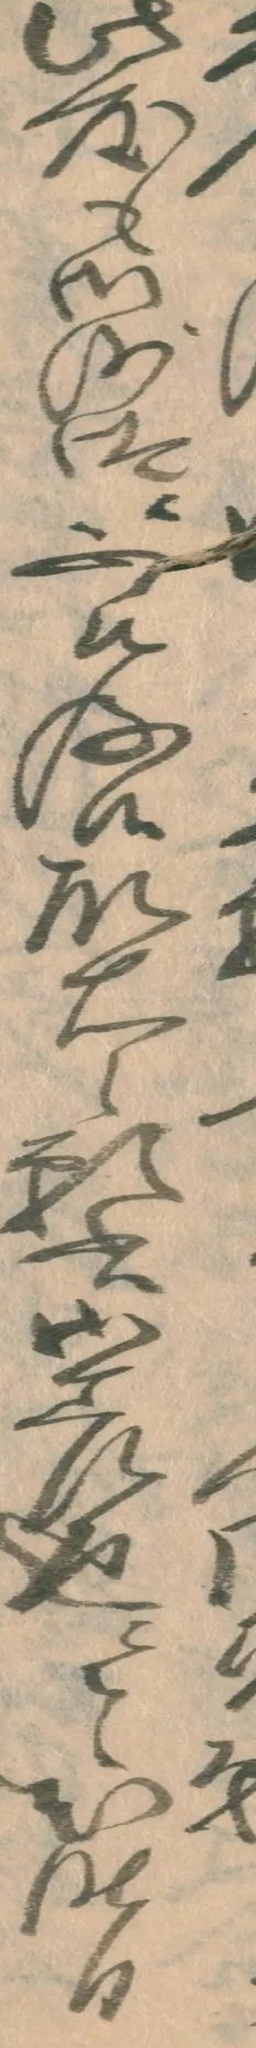此度も御沙汰ニ不被及候故右之願書御差返ニ候尤昨日
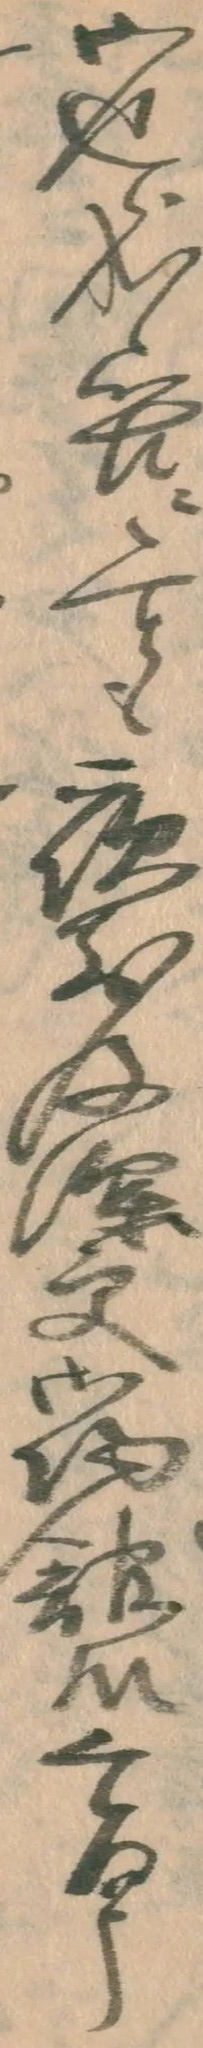御返被成候筈ニ候へとも夜前及深更御帰館故今日申
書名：賀茂社記録. 第60冊
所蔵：国立国会図書館 National Diet Library, JAPAN
